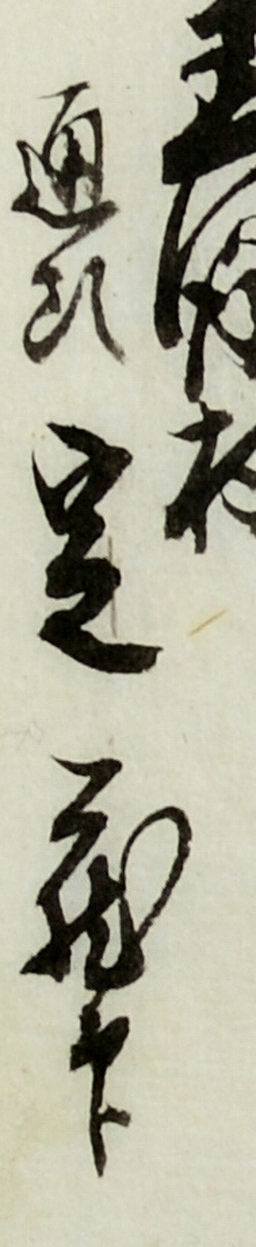通頭定蔵印

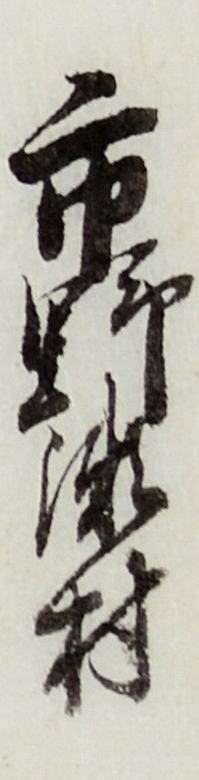市野瀬村
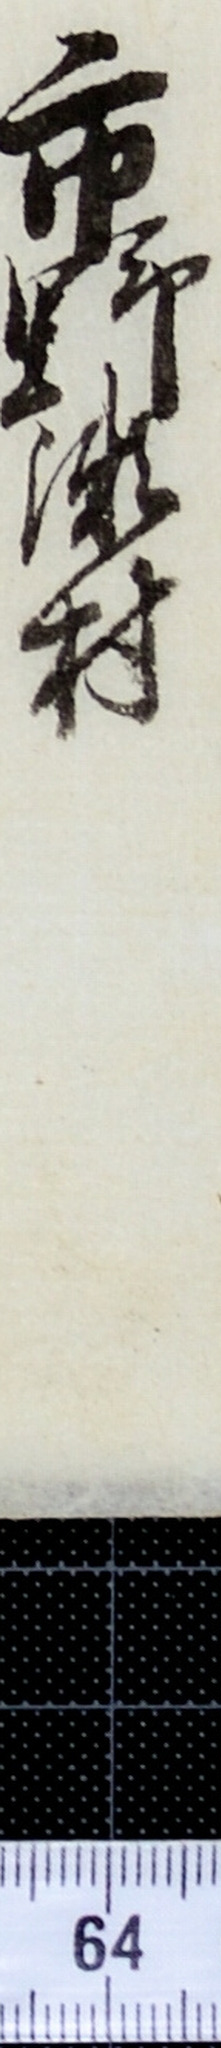市野瀬村
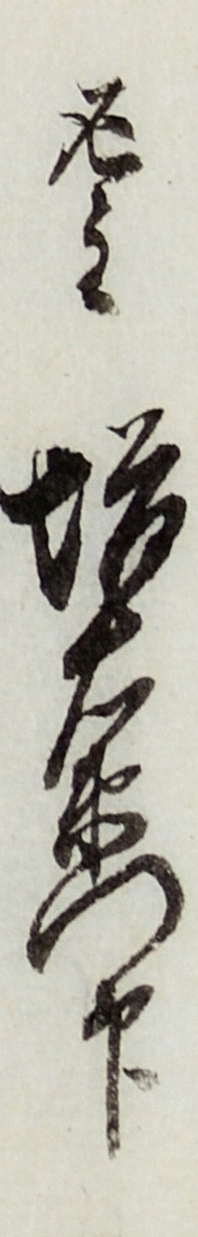名主増右衛門印
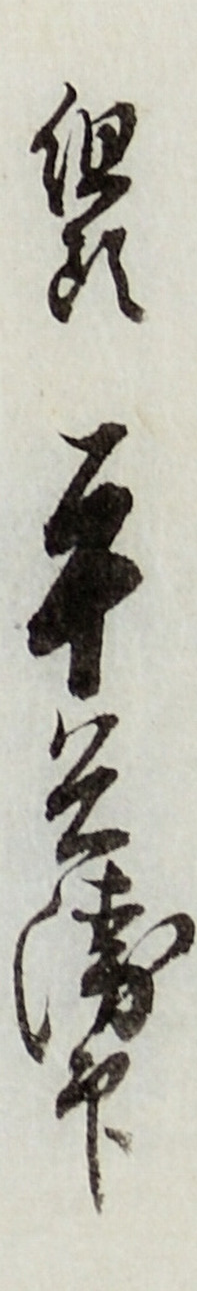組頭平兵衛印
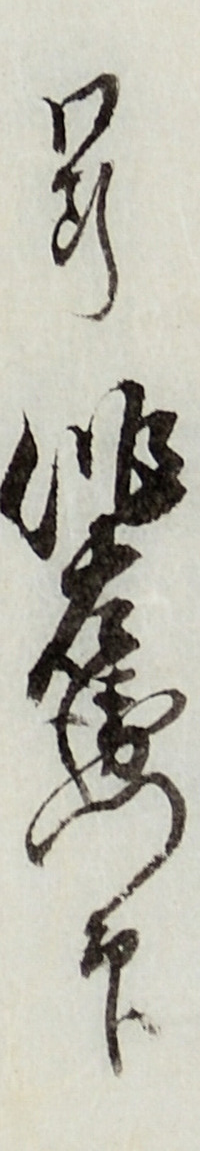同断作右衛門印
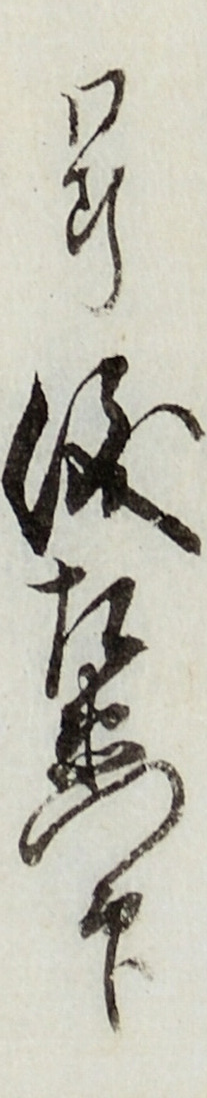同断儀左衛門印
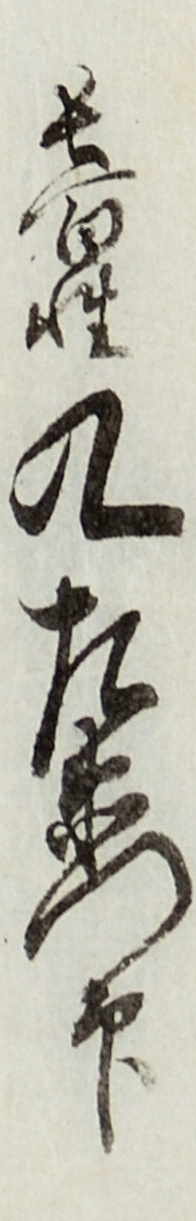長百姓九左衛門印
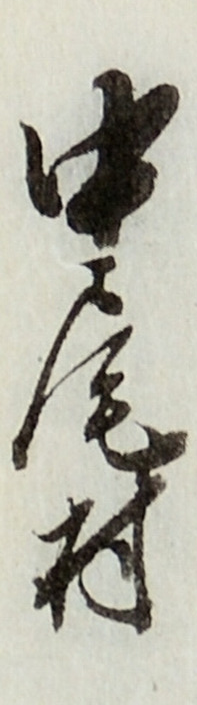中尾村
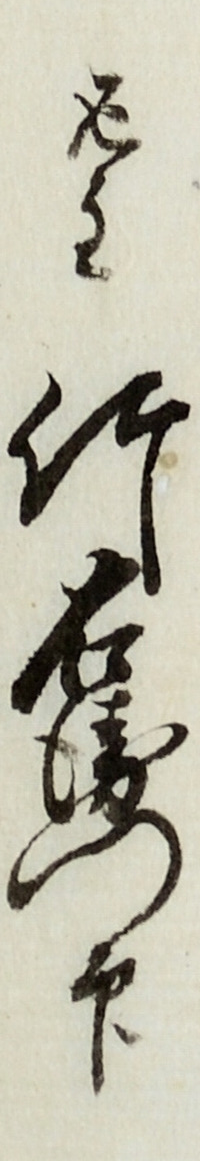名主竹右衛門印
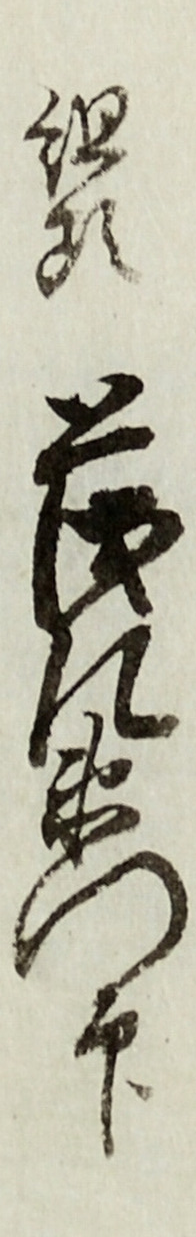組頭茂左衛門印
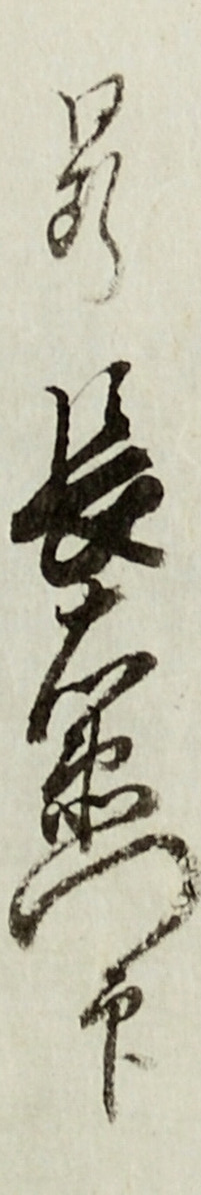同断長右衛門印
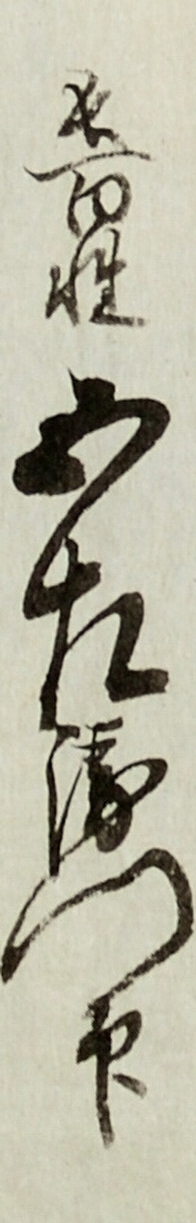長百姓九左衛門印
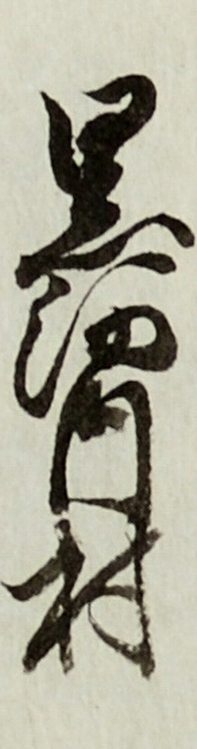黒河内村
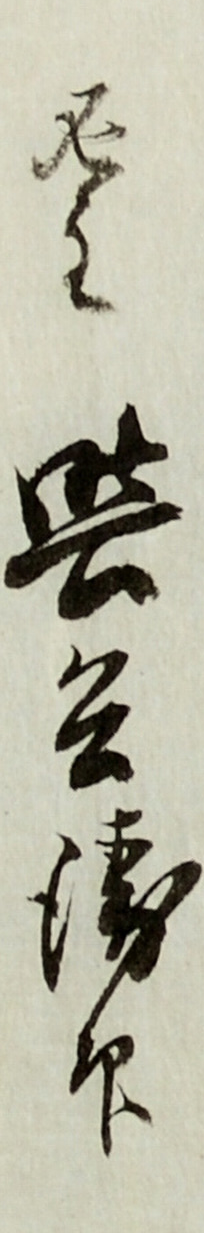名主与兵衛印
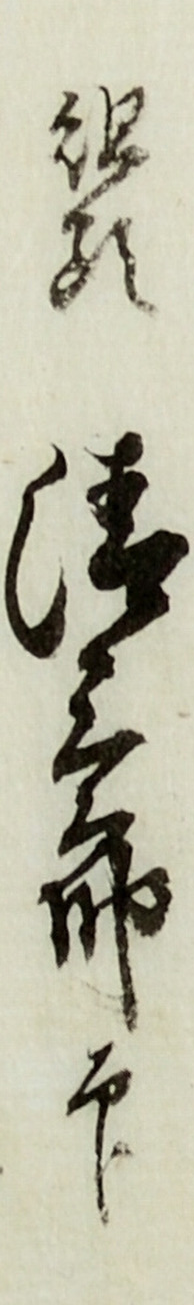組頭清三郎印
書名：御薪方掟控
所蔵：伊那市立高遠町図書館・合同会社AMANE
